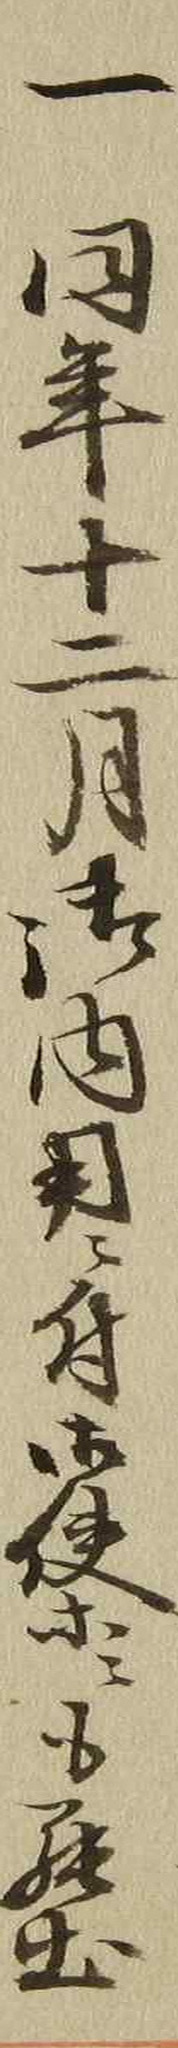一同年十二月御内用ニ付御使等ニも罷出
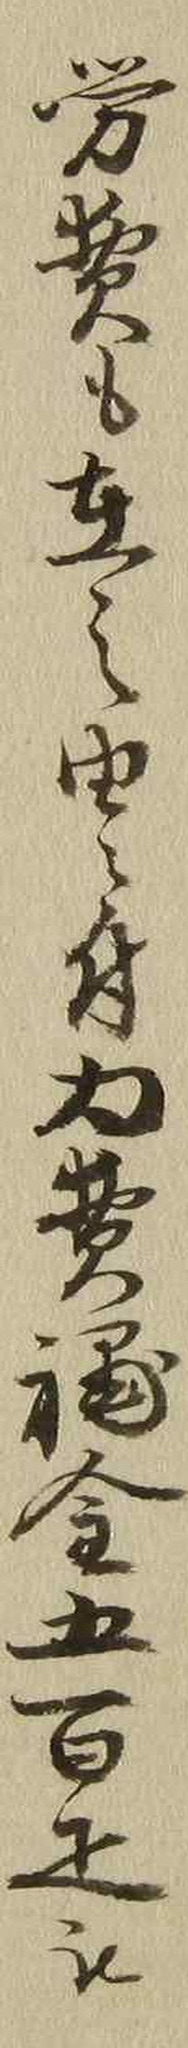労費も在之由ニ付為費補金五百疋被
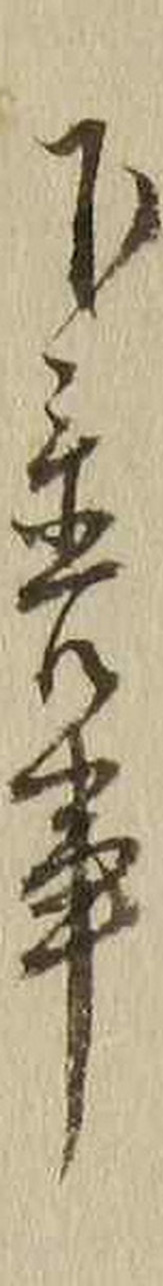下置候事
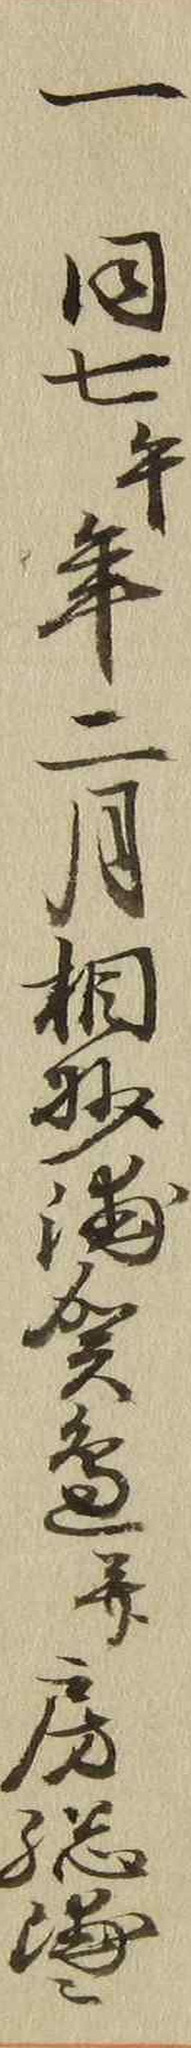一同七午年二月相州浦賀辺幷房総浦ニ
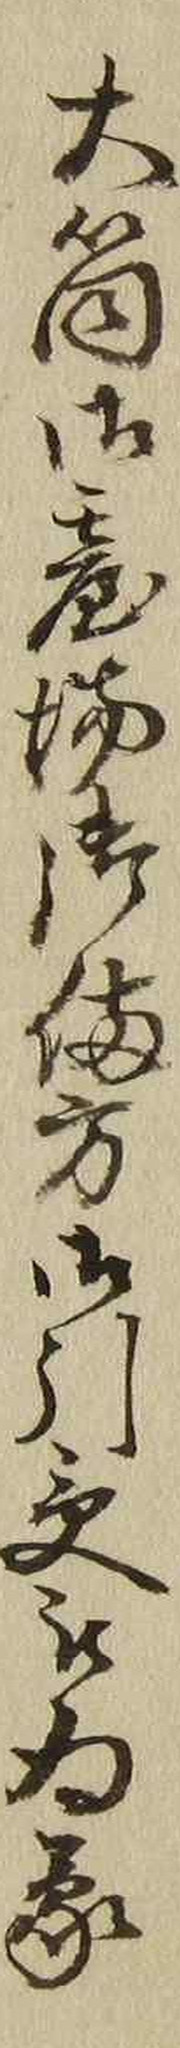大筒御台場御備方御引受被成蒙
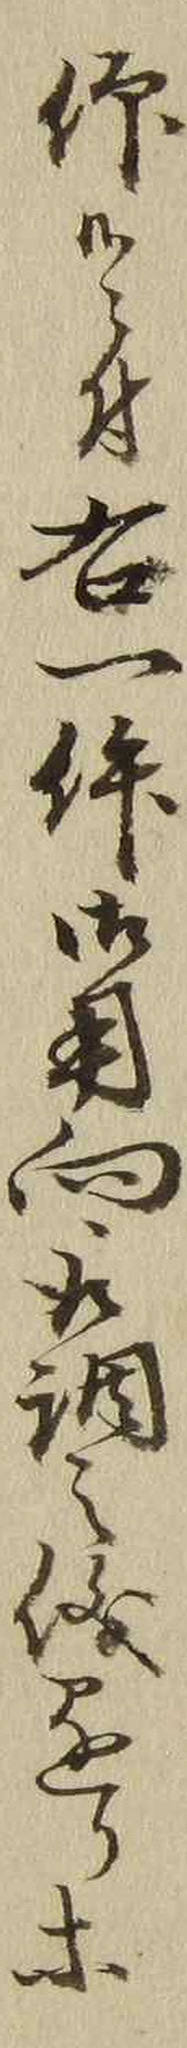仰候ニ付右一件御用向取調之儀懸り等
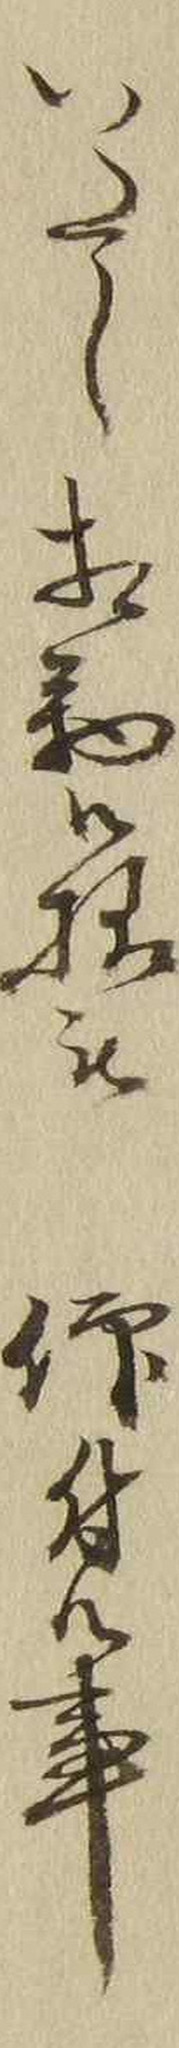いたし相勤候候仰付候事
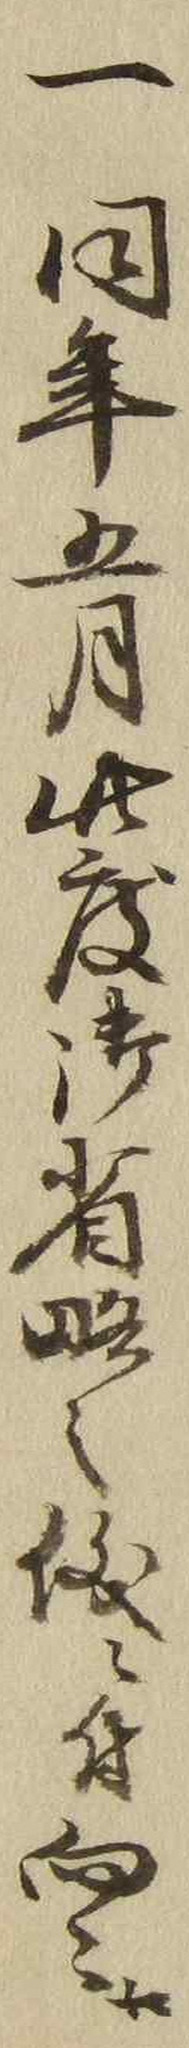一同年五月此度御省略之儀ニ付向々江

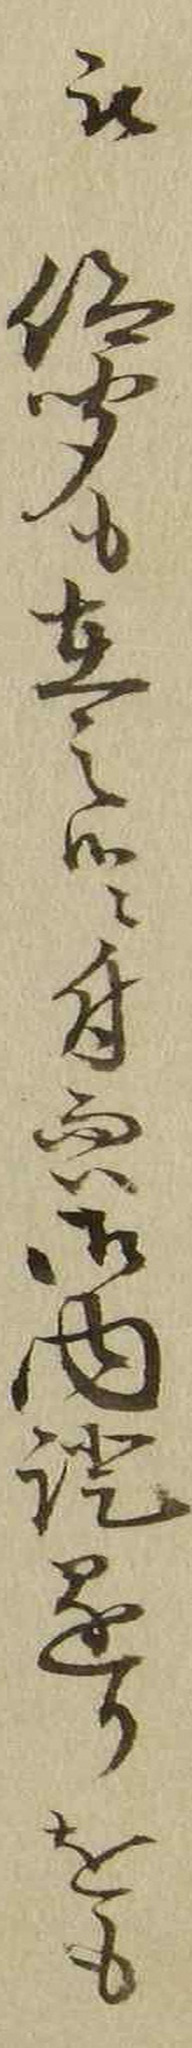被仰聞も在之候ニ付而ハ御内証懸りをも
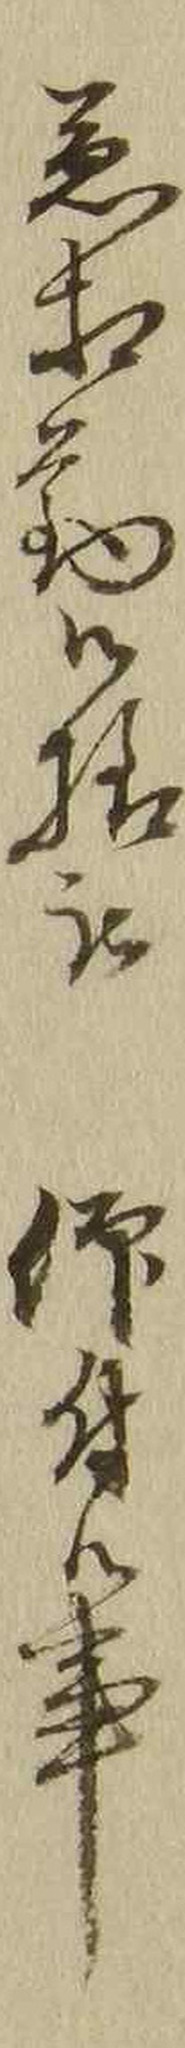兼相勤候様被仰付候事
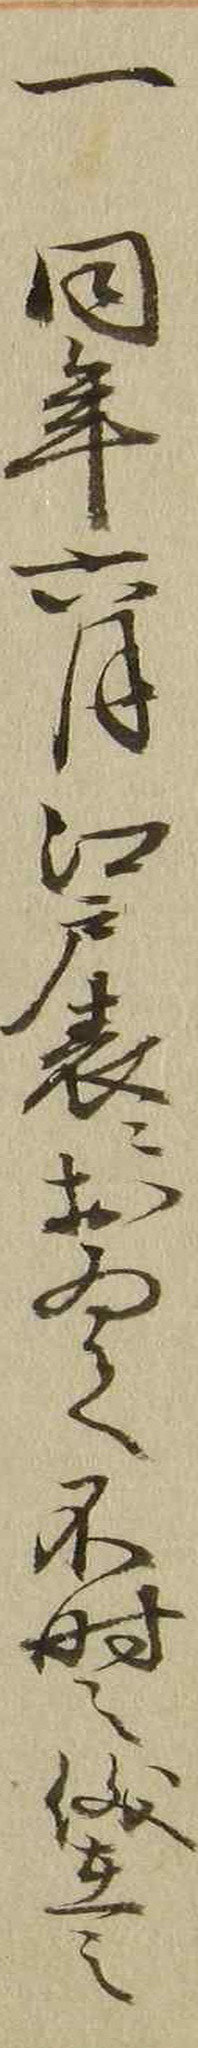一同年六月江戸表ニおいて不時之儀在之
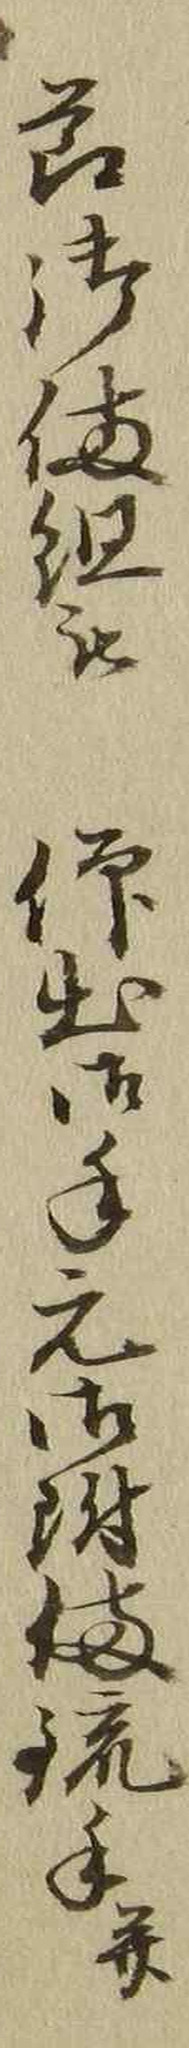節御備組被仰出御手元御附備琉手幷
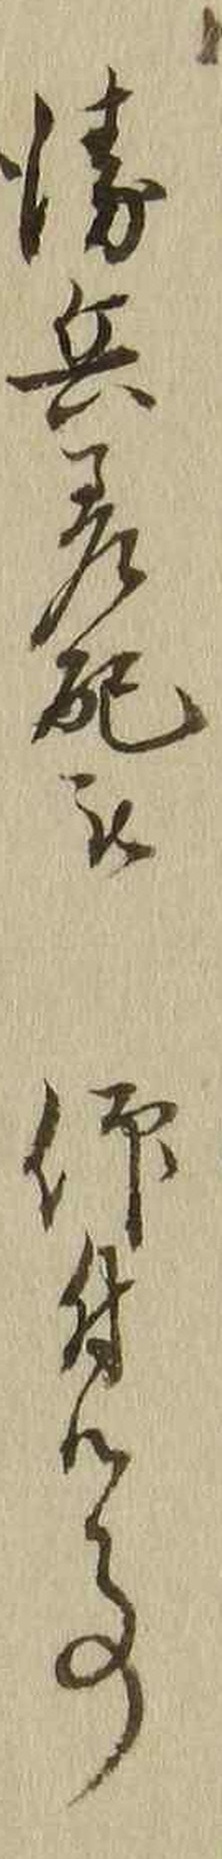衛兵差配被仰付候事
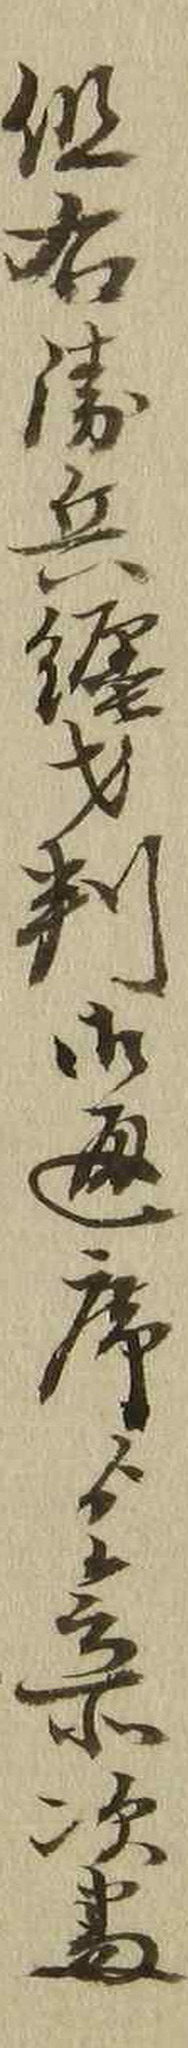但右衛兵纏才判御通席ゟ会所次番
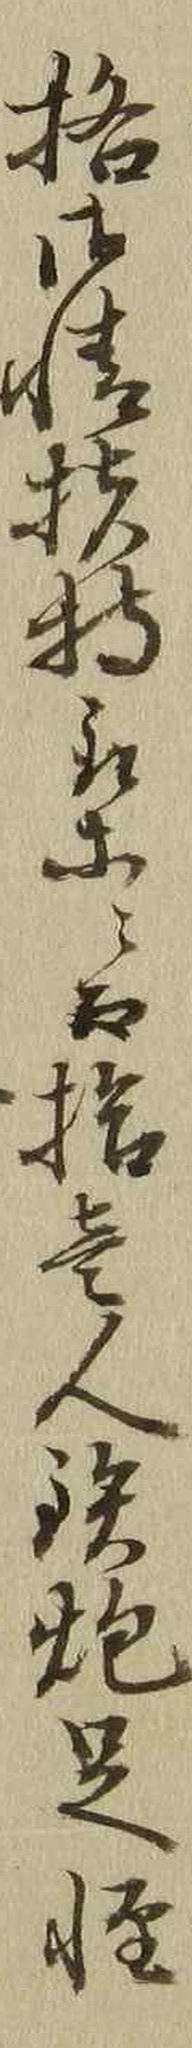挌御情扶持取等ニ而拾壱人鉄砲足軽
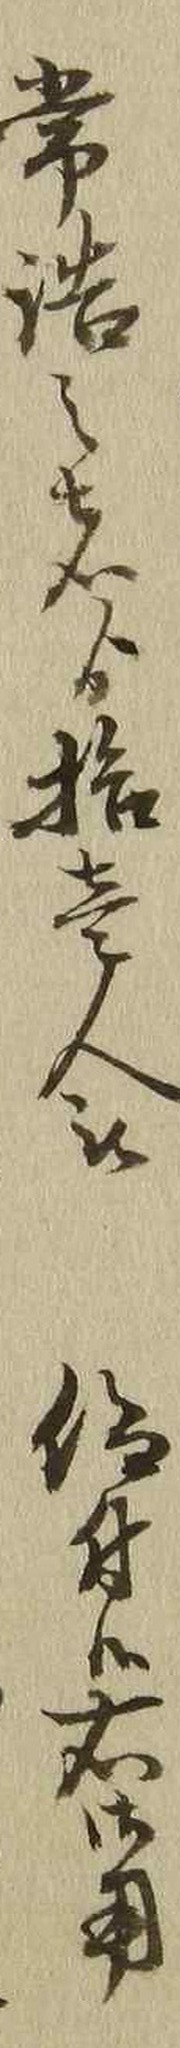常詰之者ゟ拾壱人被仰付候右御用
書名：諸士系譜　巻之64　と之部7
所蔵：会津若松市立会津図書館
